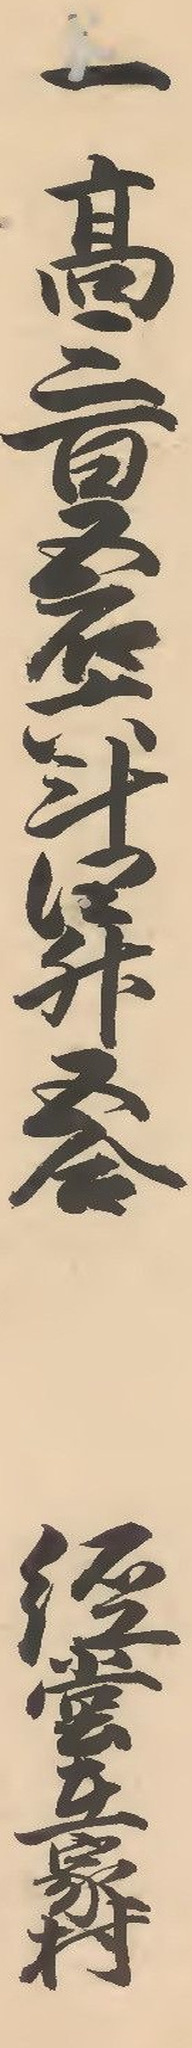一高三百五石六斗四升五合経堂在家村

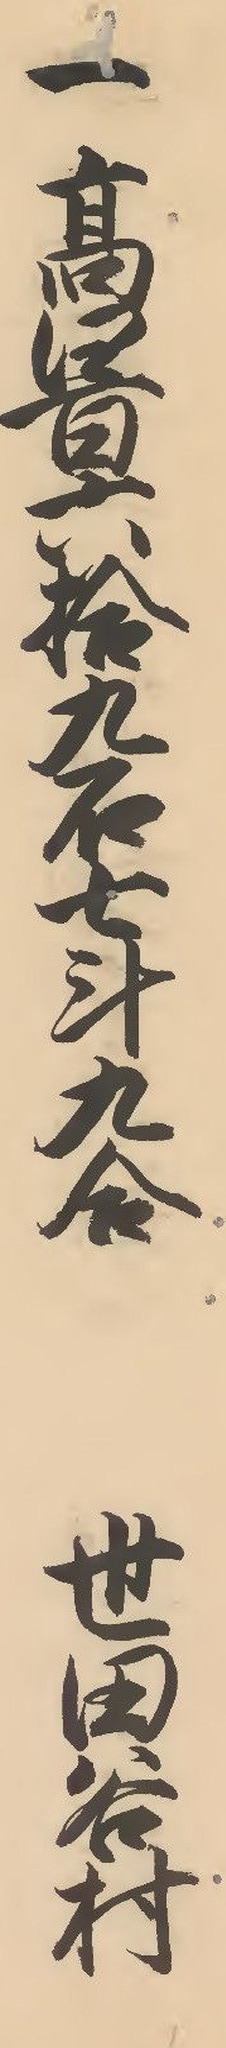一高四百六拾九石七斗九合世田谷村
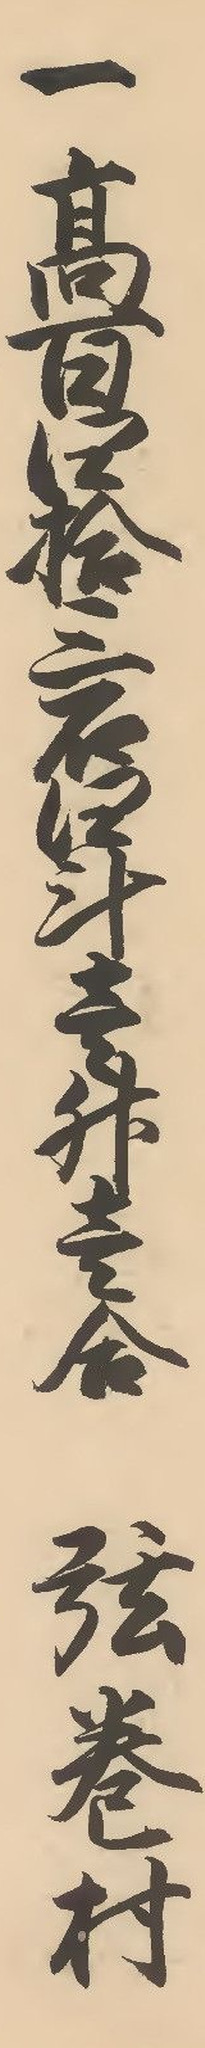一高百四拾三石四斗壱升壱合弦巻村
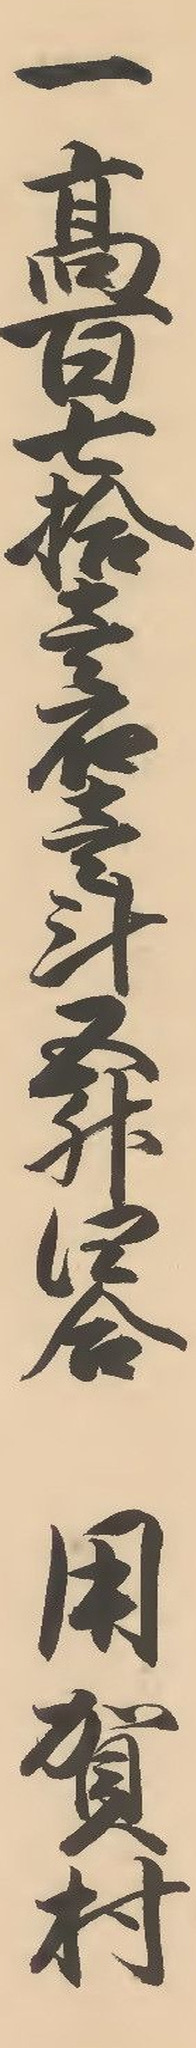一高百七拾壱石壱斗五升四合用賀村
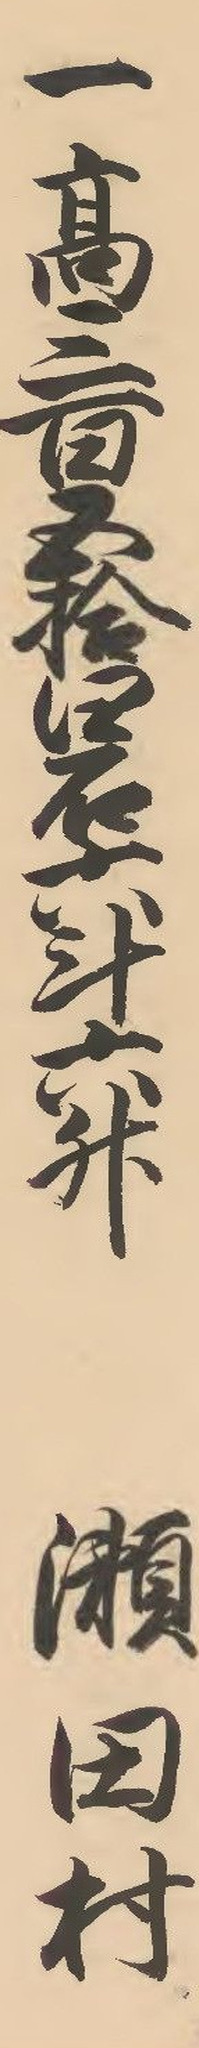一高三百五拾四石六斗六升瀬田村
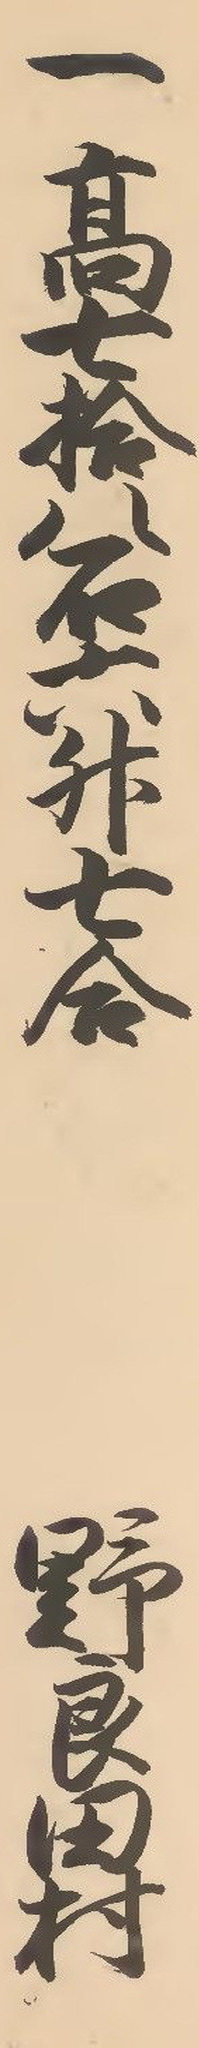一高七拾八石六升七合野良田村
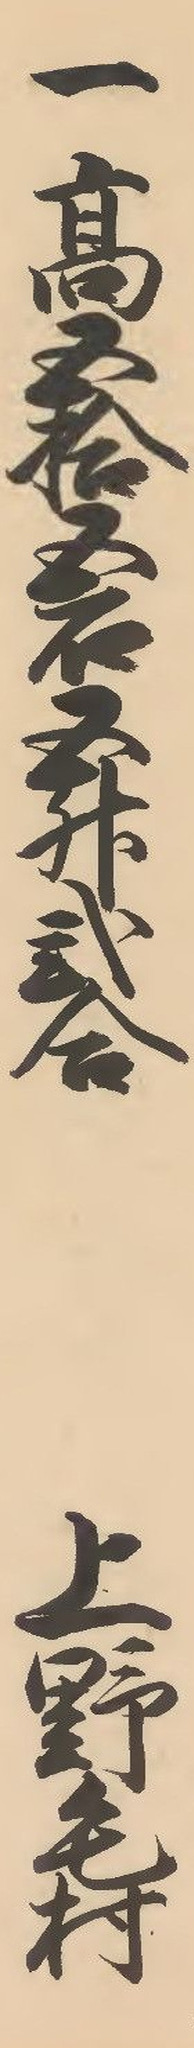一高五拾五石五升弐合上野毛村
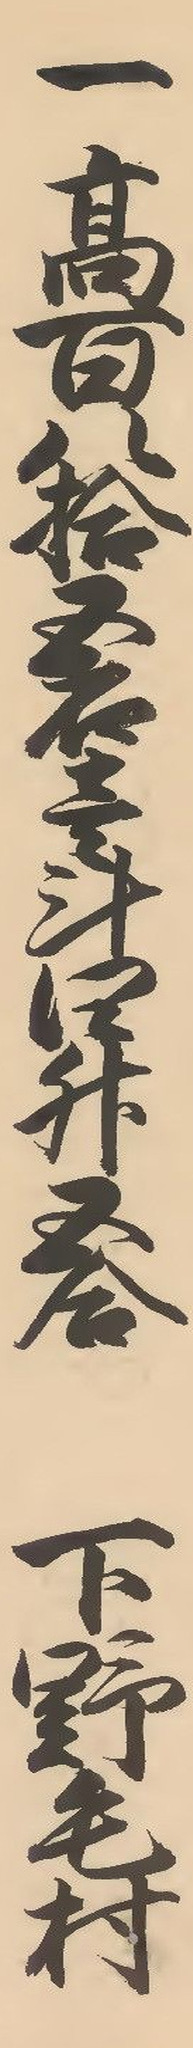一高百八拾五石壱斗四升五合下野毛村
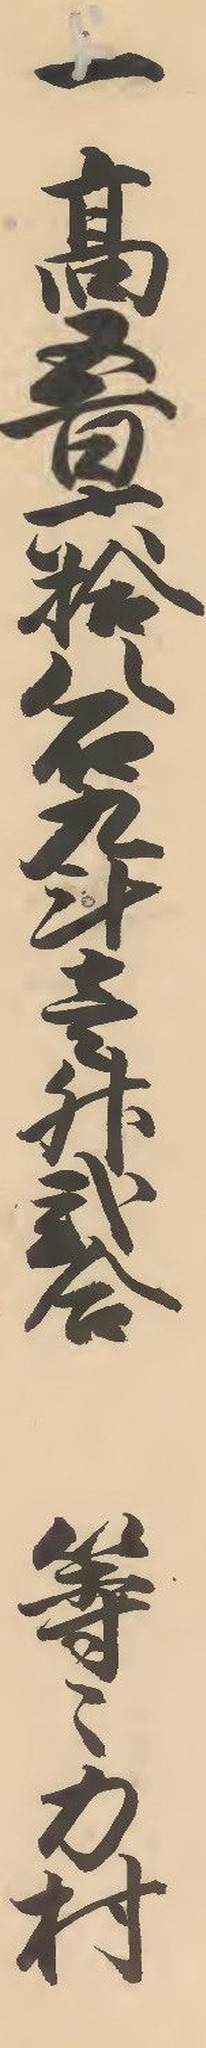一高五百六拾八石九斗壱升弐合等々力村

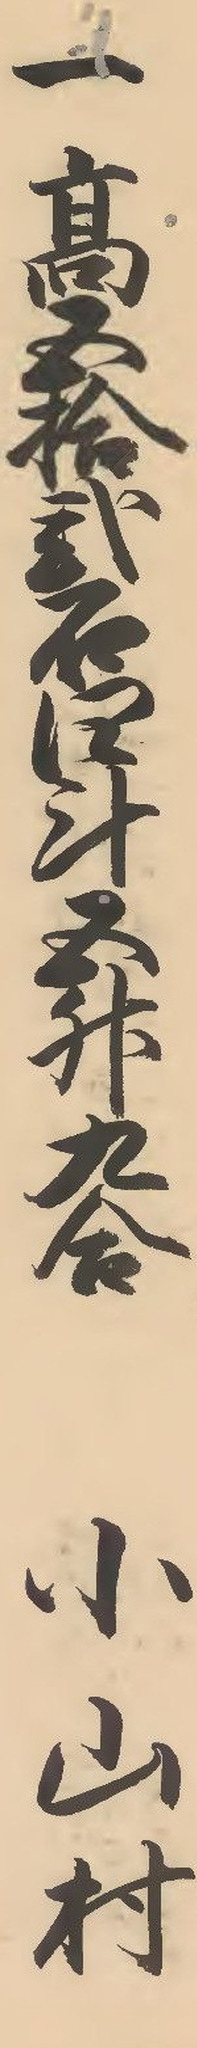一高五拾弐石四斗五升九合小山村
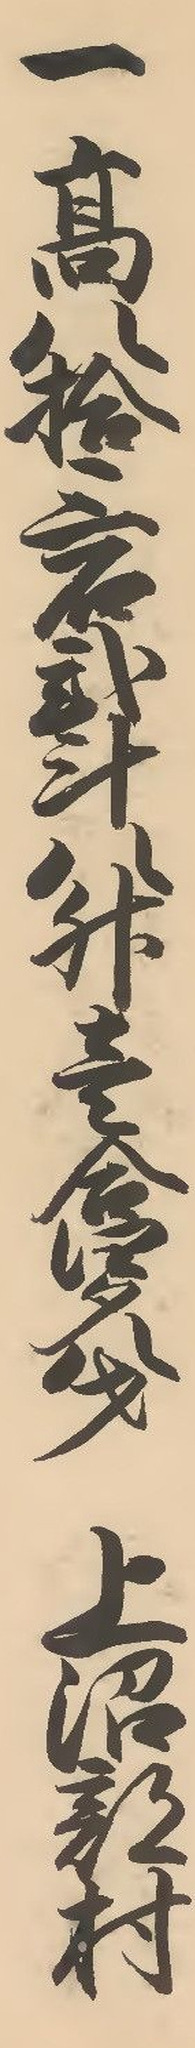一高八拾三石弐斗八升壱合四勺八才上沼部村
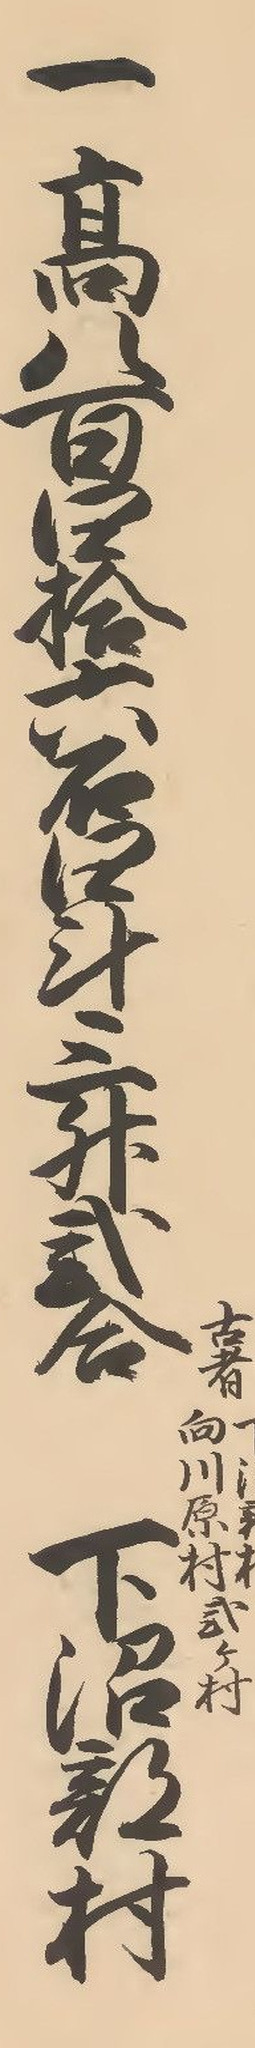一高八百四拾六石四斗三升弐合下沼部村
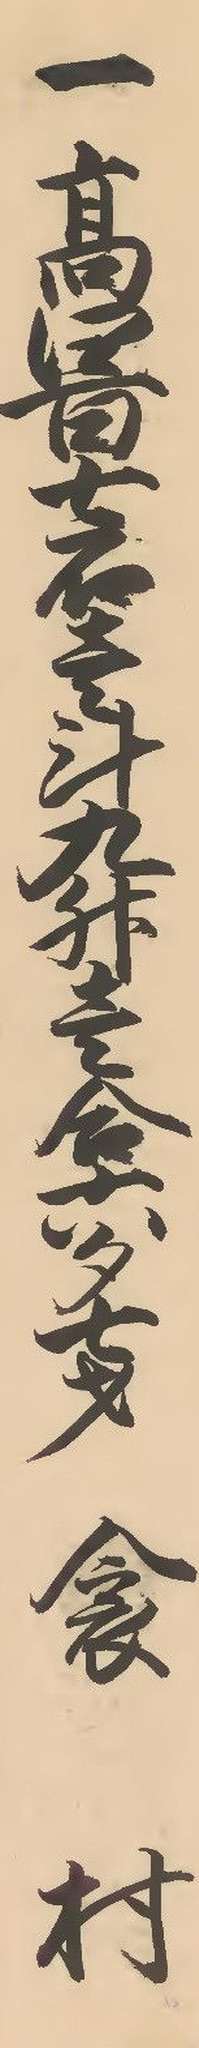一高四百七石壱斗九升壱合六勺七才衾村
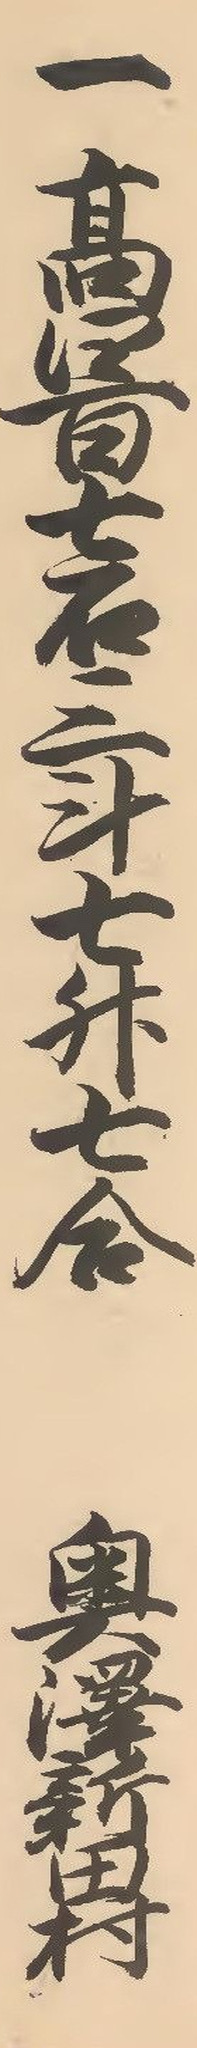一高四百七石三斗七升七合奥澤新田村
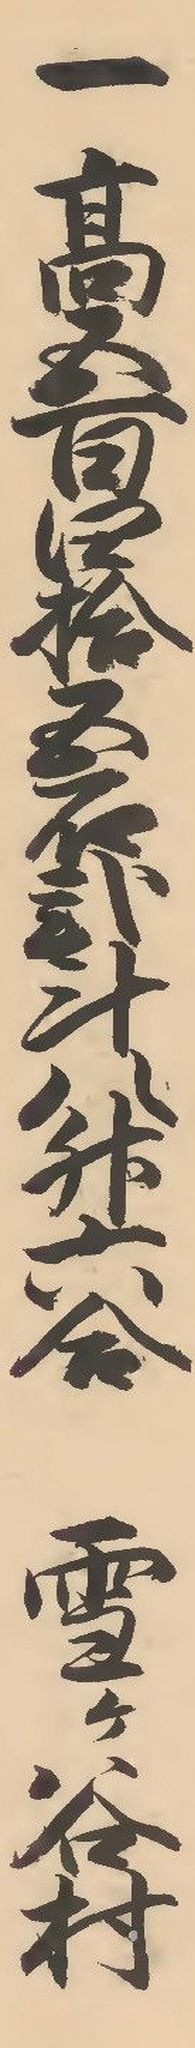一高五百四拾五石弐斗八升六合雪ヶ谷村
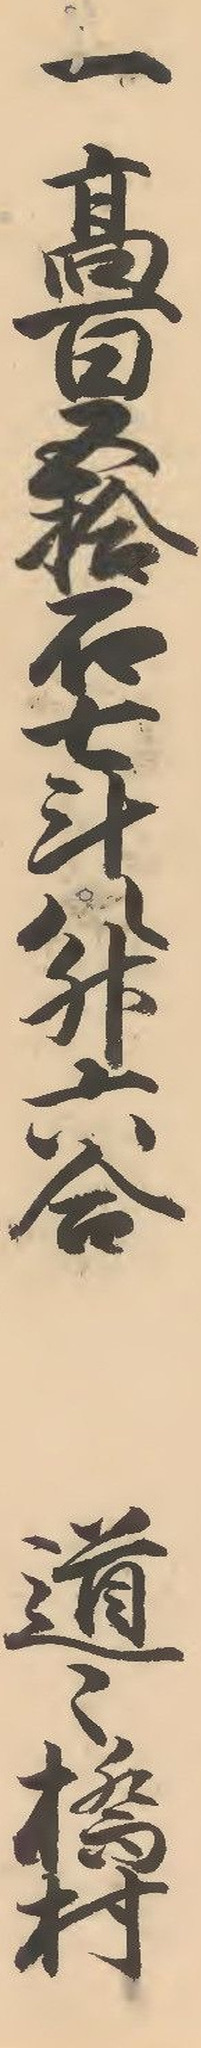一高百五拾石七斗八升六合道々橋村
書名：武蔵国郷帳　上
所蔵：国立公文書館 National Archives of Japan
